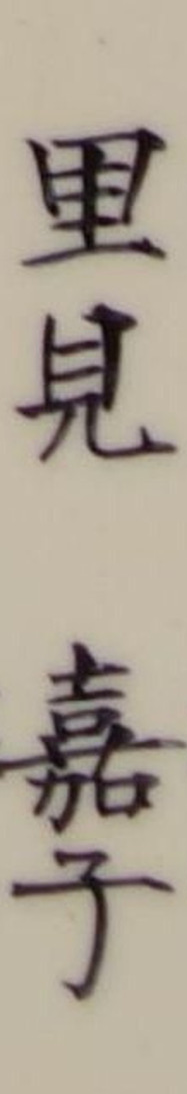里見嘉子
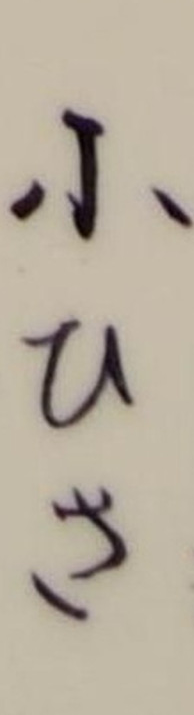小ひさ
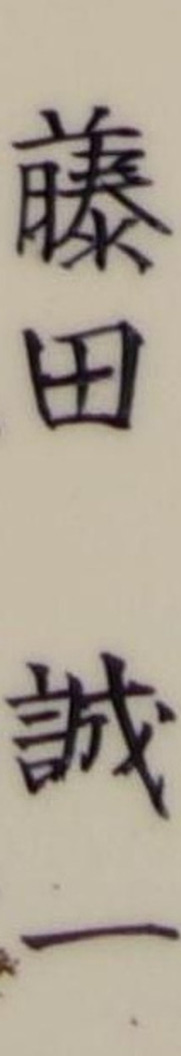藤田誠一
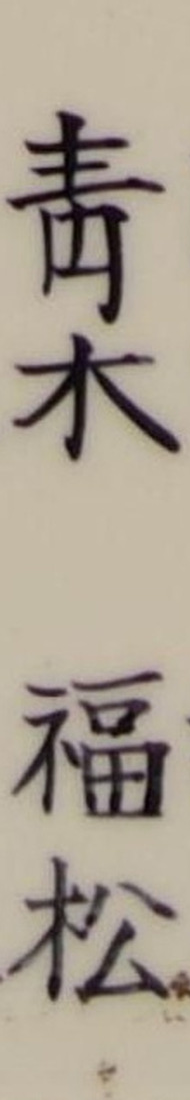青木福松
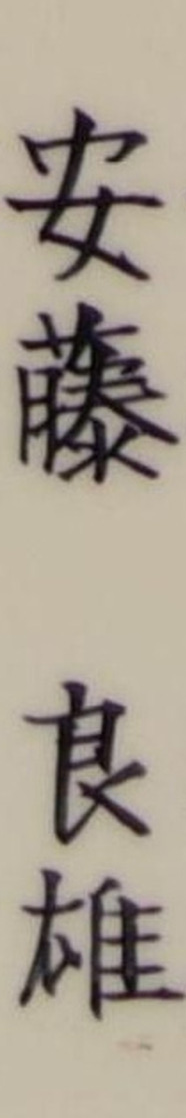安藤良雄
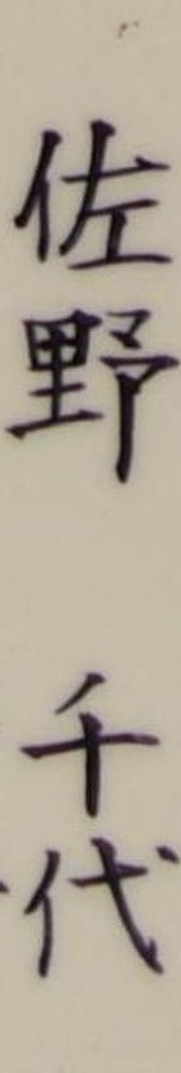佐野千代
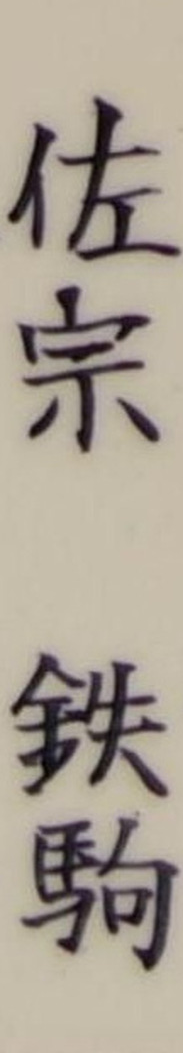佐宗鉄駒
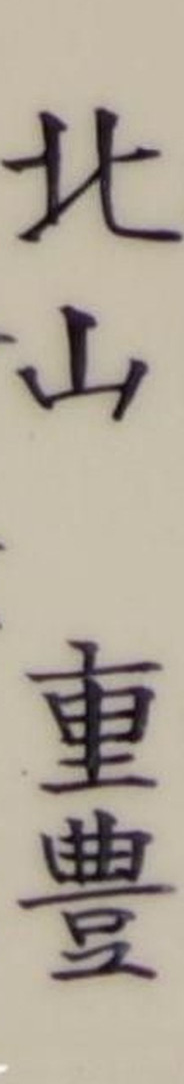北山重豊
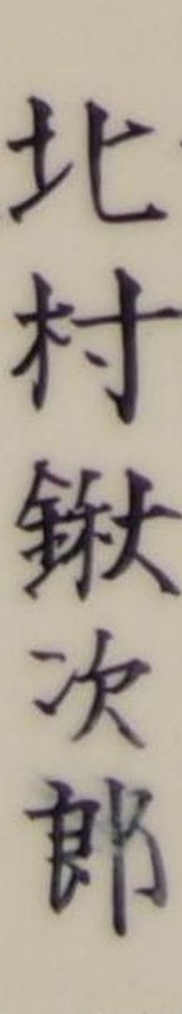北村鍬次郎
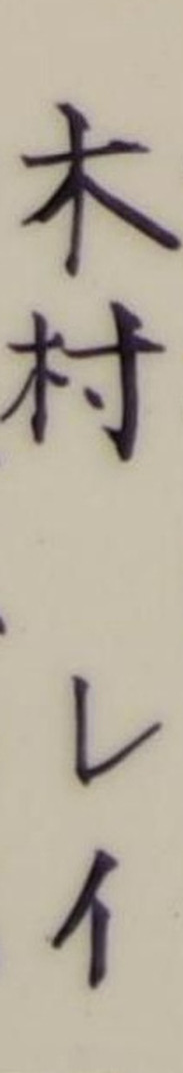木村レイ
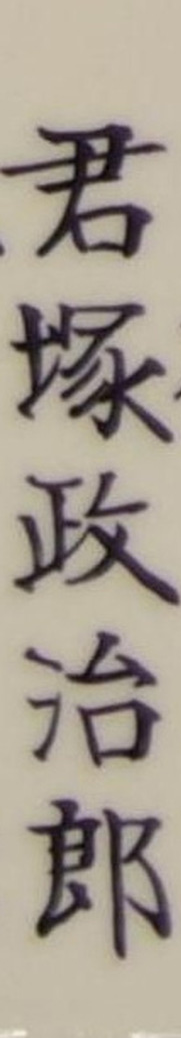君塚政治郎
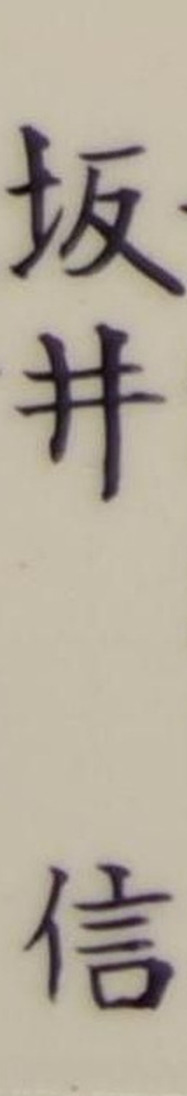坂井信
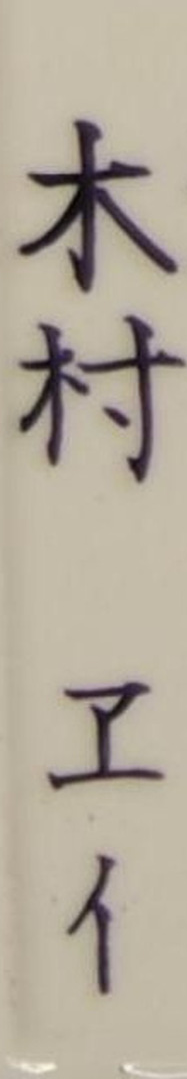木村レイ

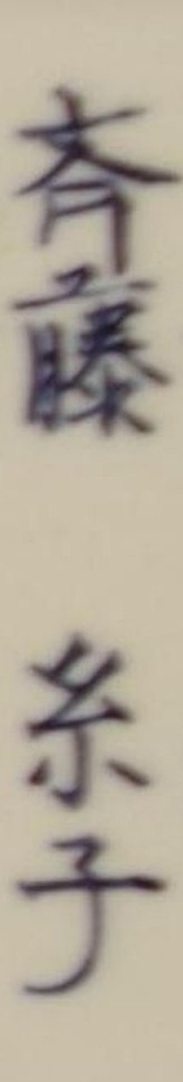斉藤糸子
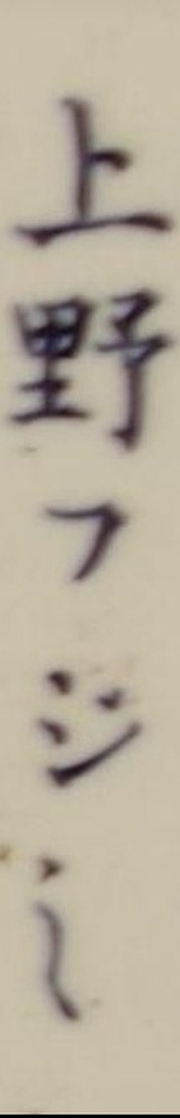上野フジミ
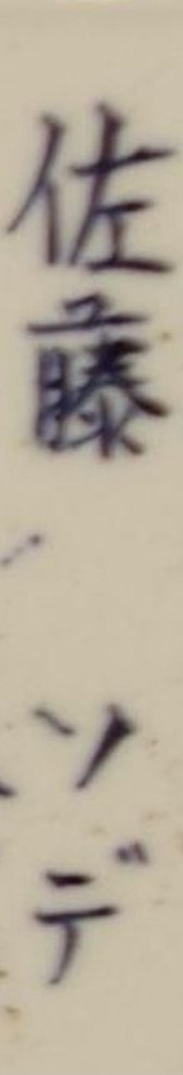佐藤ソデ
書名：M~S
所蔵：高野山金剛峯寺
